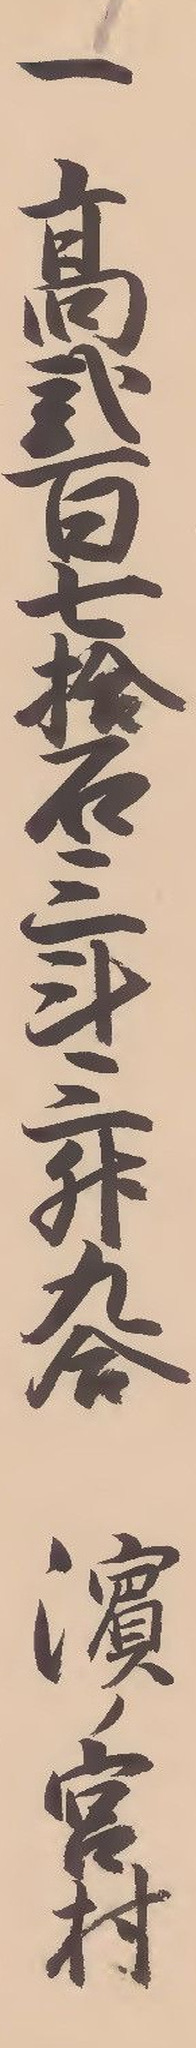一高弐百七拾石三斗三升九合浜ノ宮村
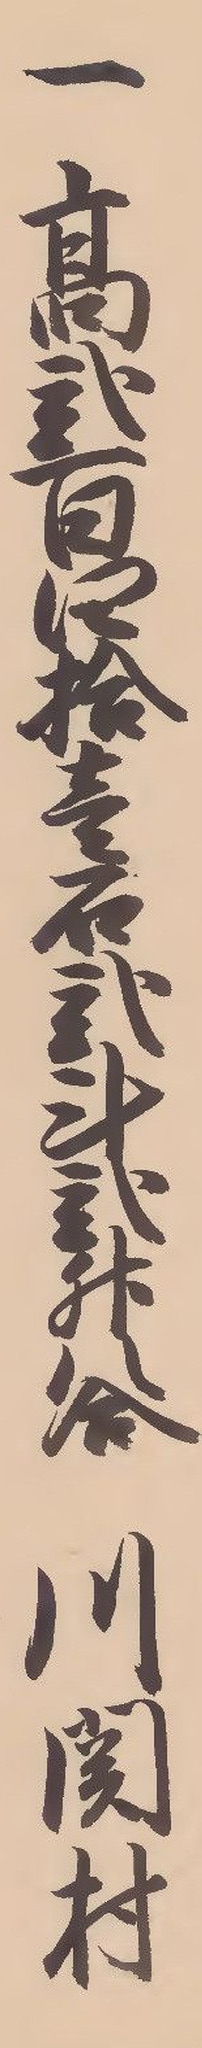一高弐百四拾壱石弐斗弐升八合川関村
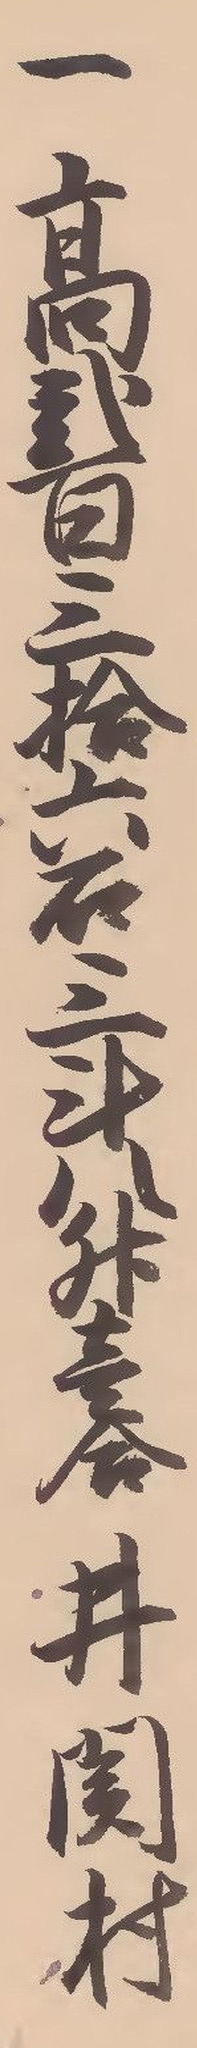一高弐百三拾六石三斗八升壱合井関村

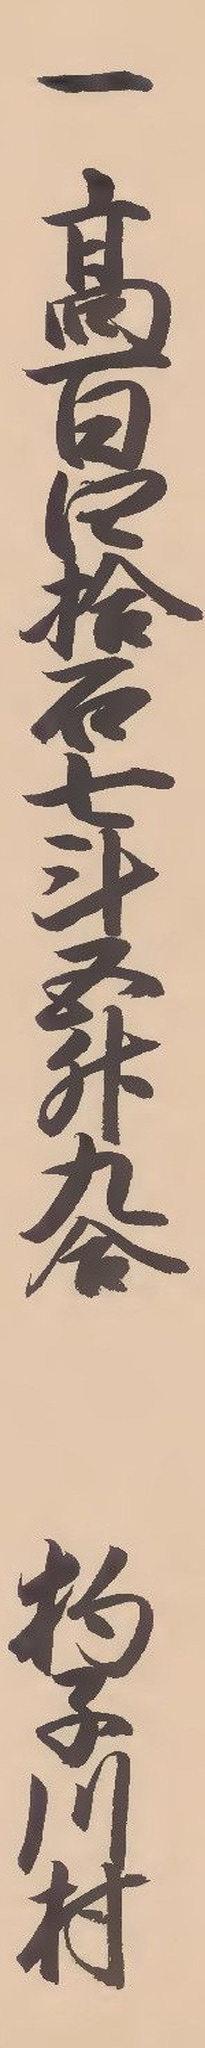一高百四拾石七斗五升九合杓子川村
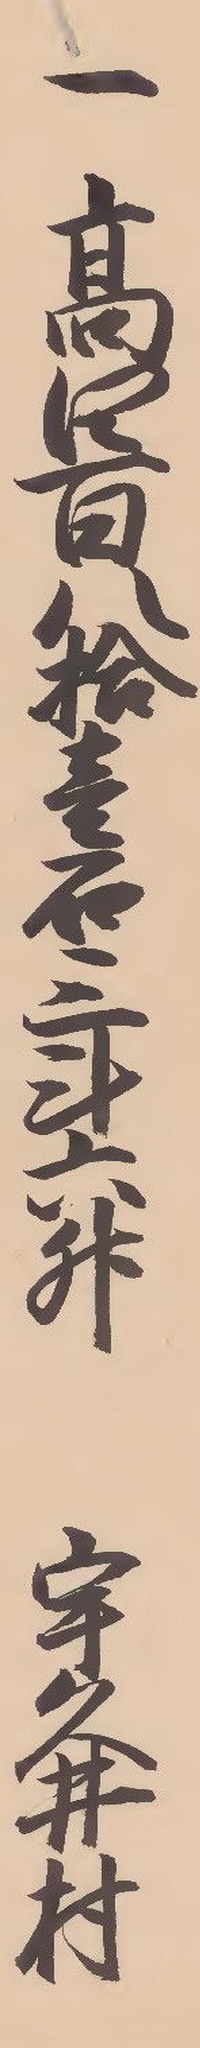一高四百八拾壱石三斗六升宇久井村
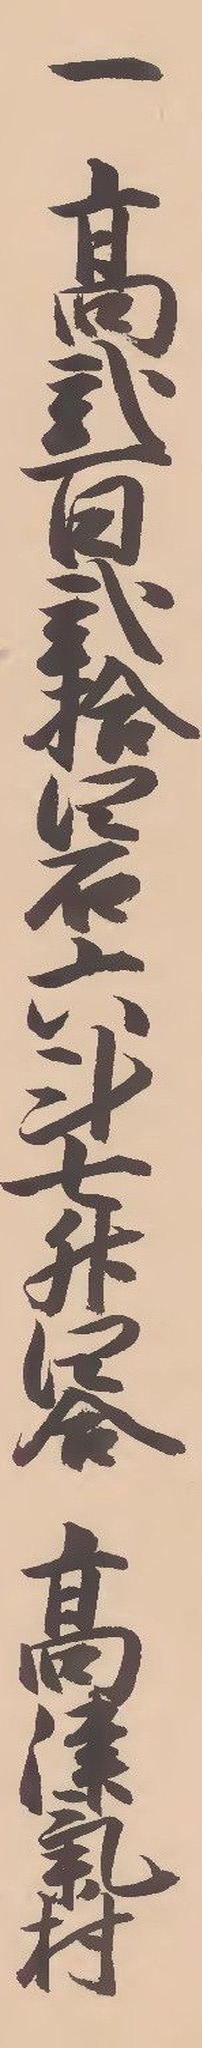一高弐百弐拾四石六斗七升四合高津気村
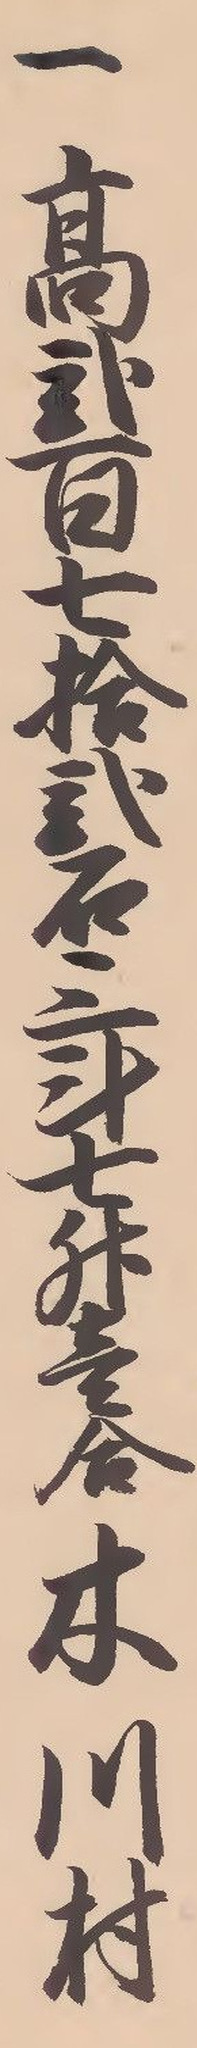一高弐百七拾弐石三斗七升壱合木川村
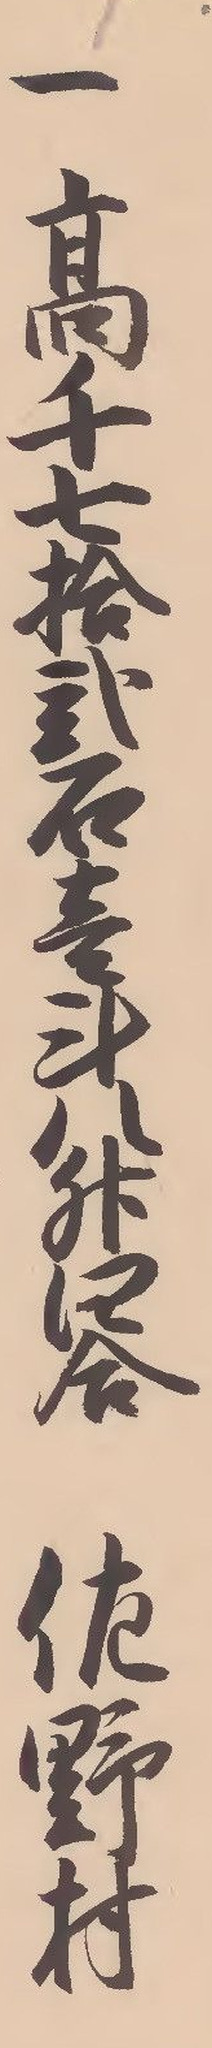一高千七拾弐石壱斗八升四合佐野村
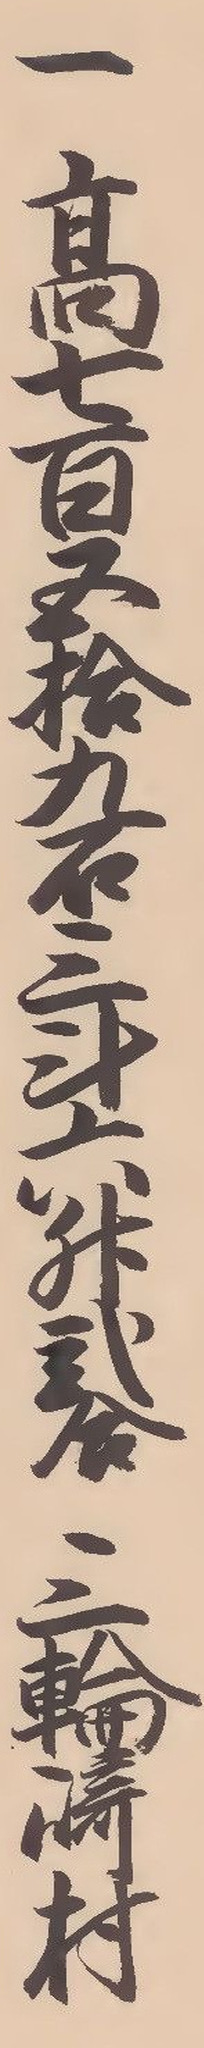一高七百五拾九石三斗六升弐合三輪崎村
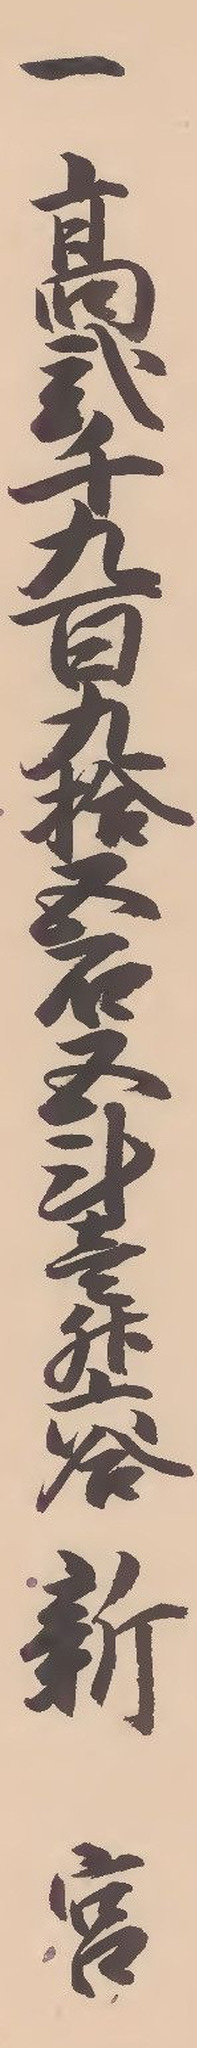一高弐千九百九拾五石五斗壱升六合新宮

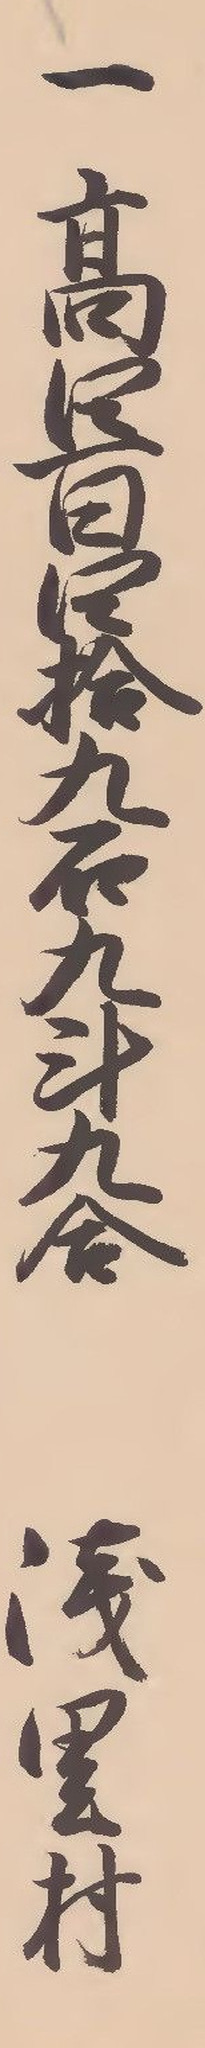一高四百四拾九石九斗九合浅里村
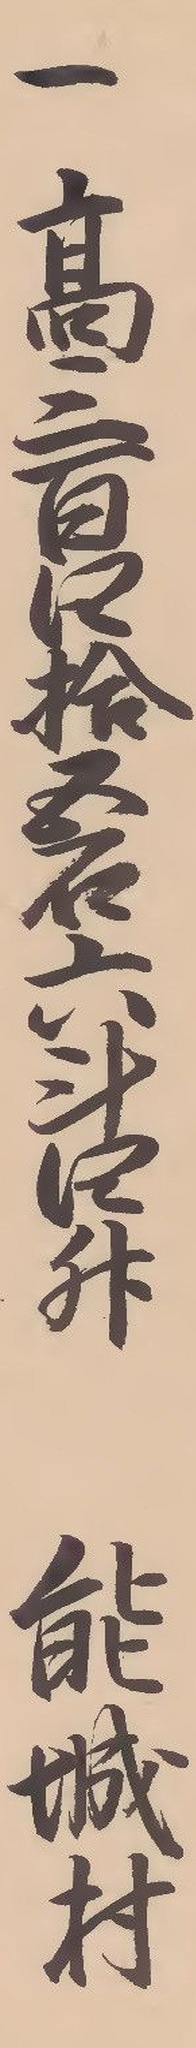一高三百四拾五石六斗四升能城村
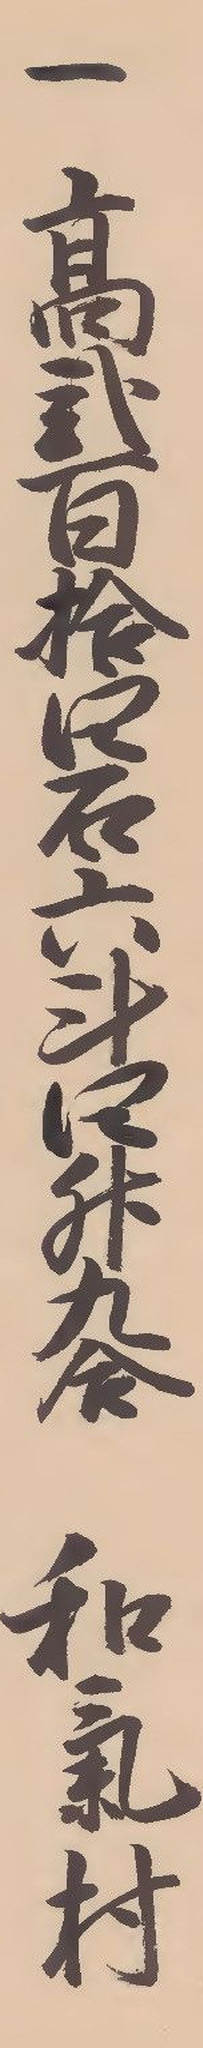一高弐百拾四石六斗四升九合和気村

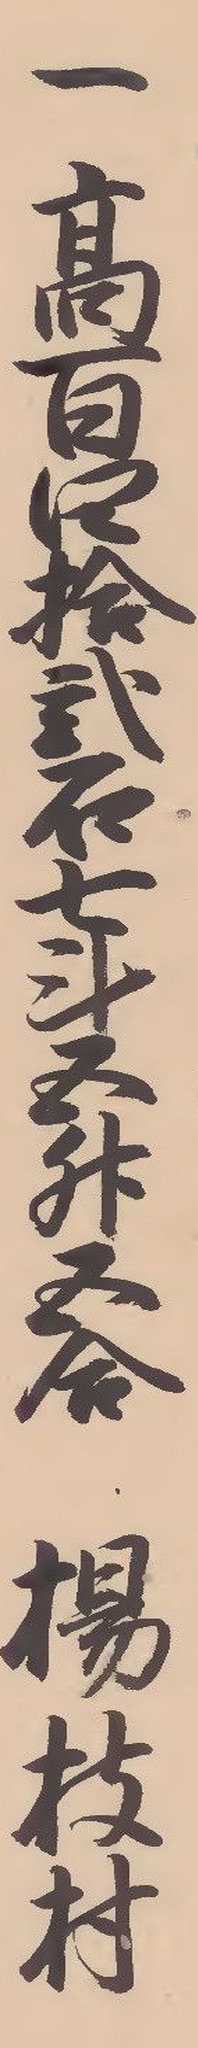一高百四拾弐石七斗五升五合楊枝村
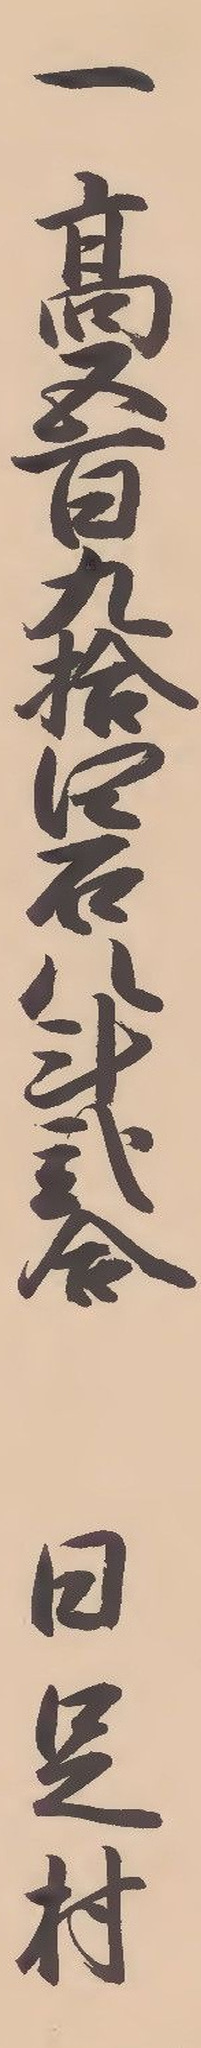一高五百九拾四石八斗弐合日足村
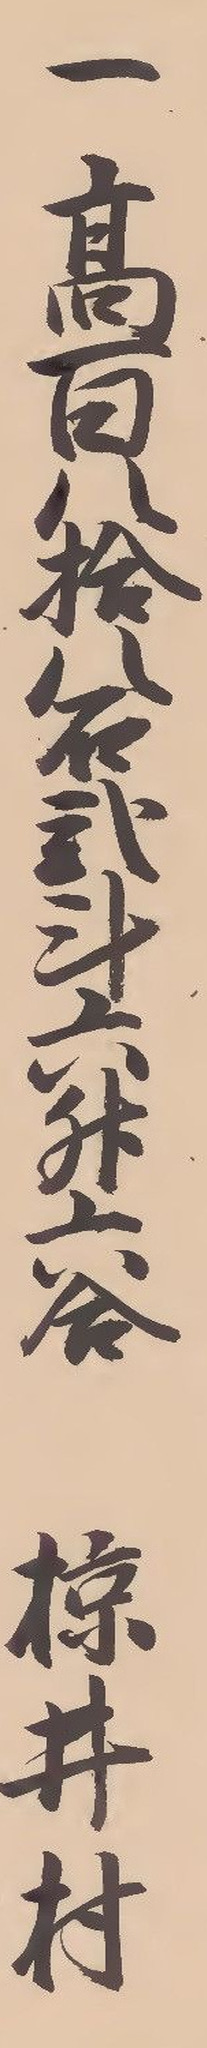一高百八拾八石弐斗六升六合椋井村
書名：紀伊国郷帳
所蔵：国立公文書館 National Archives of Japan
